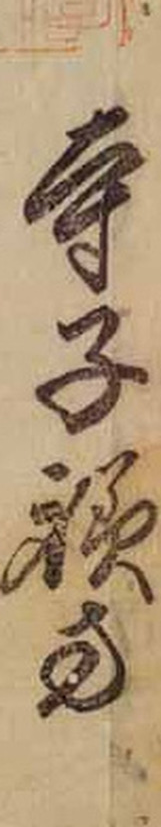寺子躾方
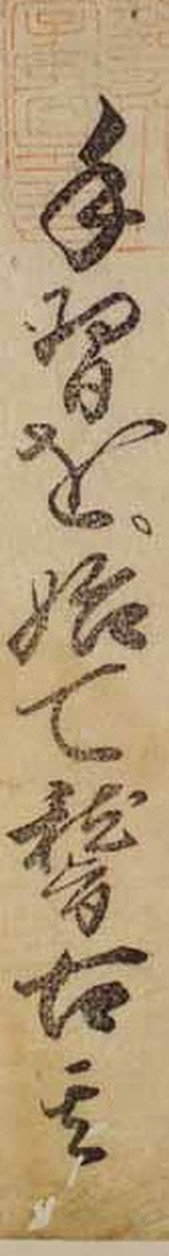手習を。始て稽古其
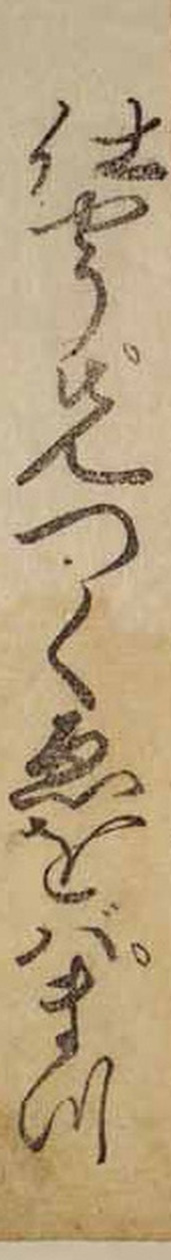仕やう。先つくゑをば。まつ
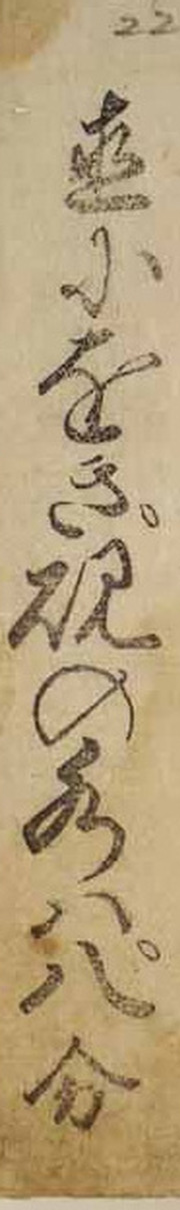直にをき。硯の水は。八分

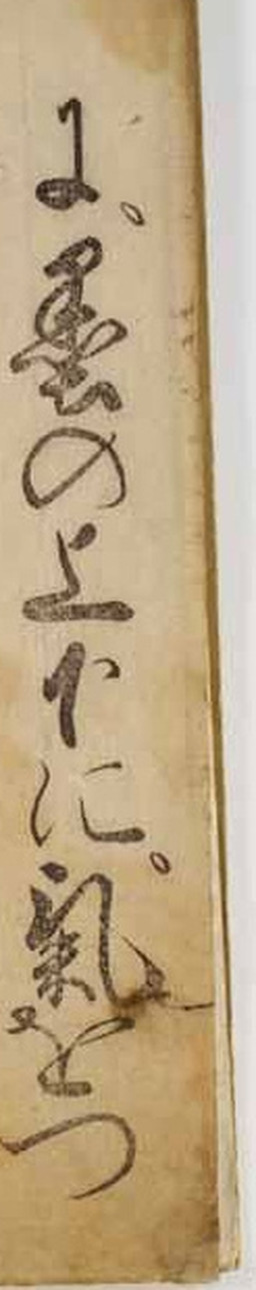に。墨の上下に。気をつ
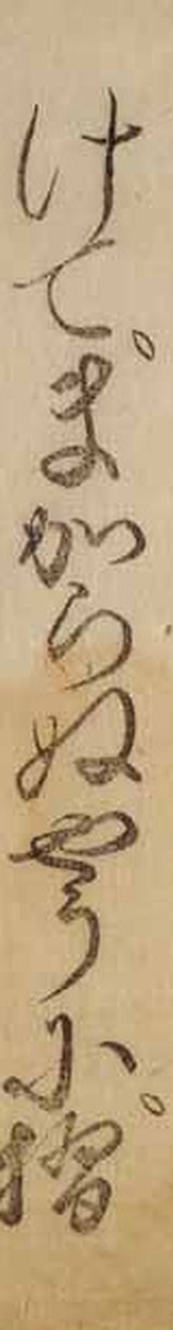けて。まからぬやうに。摺
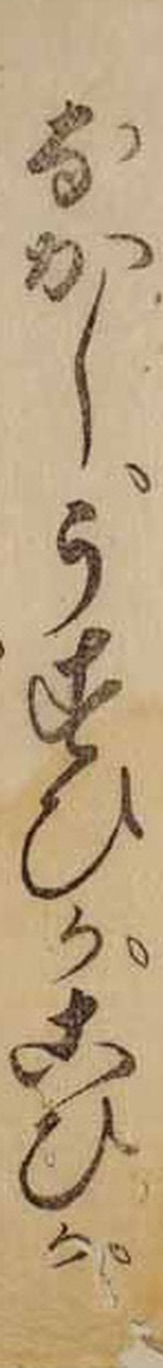なかし。うすひか。こひか。
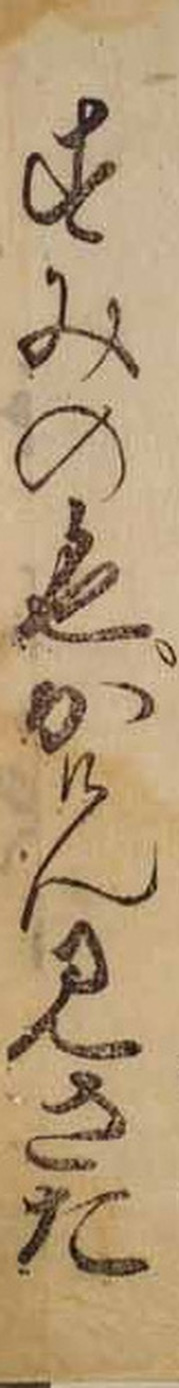すみの色。かけん見さた
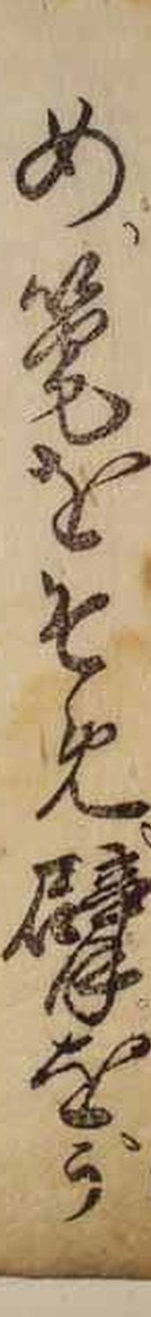め。筆をそめ。臂を。う
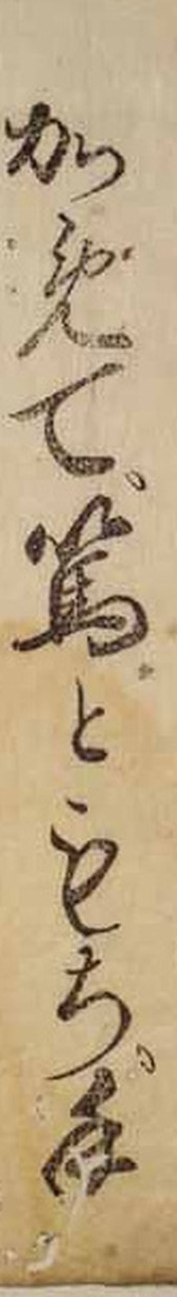かめて。篤ともち。手
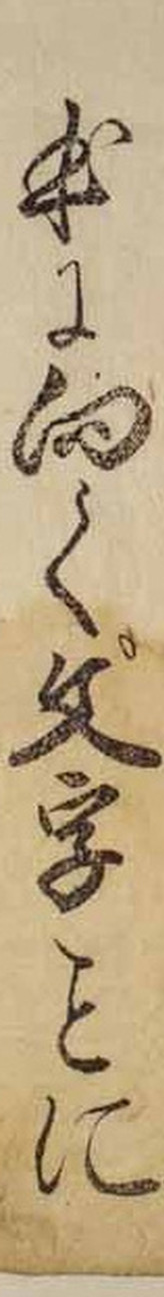本に向て。文字ことに。
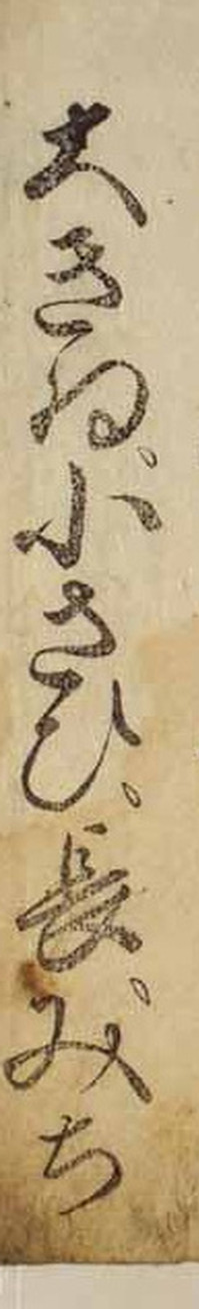大きゐ。小さひ。長。みち

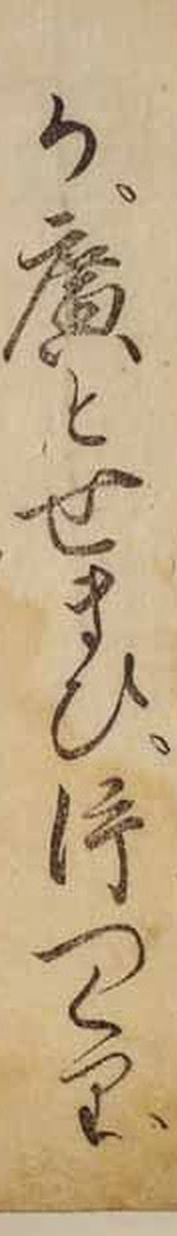か。広とせまひ。片つくり
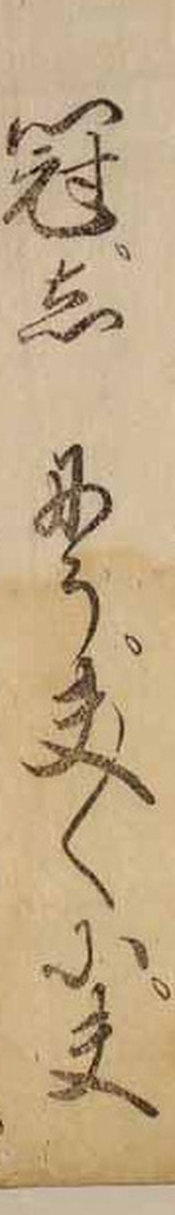冠。点にう。夫〳〵に。夫
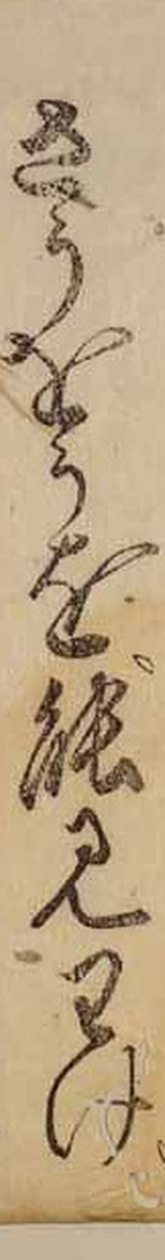さうをうを。能見わけ。
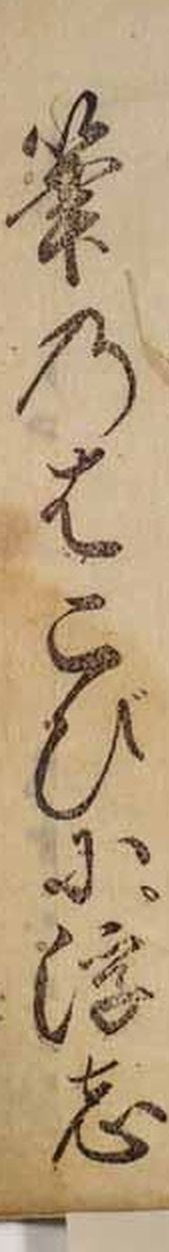筆のはこびに。浮し
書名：寺子躾方
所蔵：東京学芸大学教育コンテンツアーカイブ
